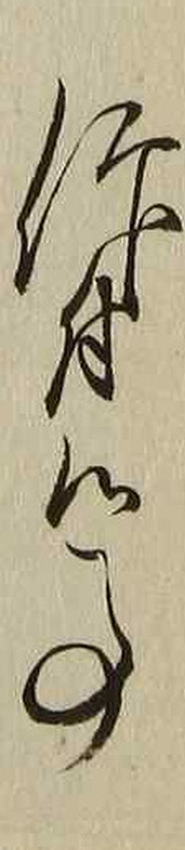仰付候事
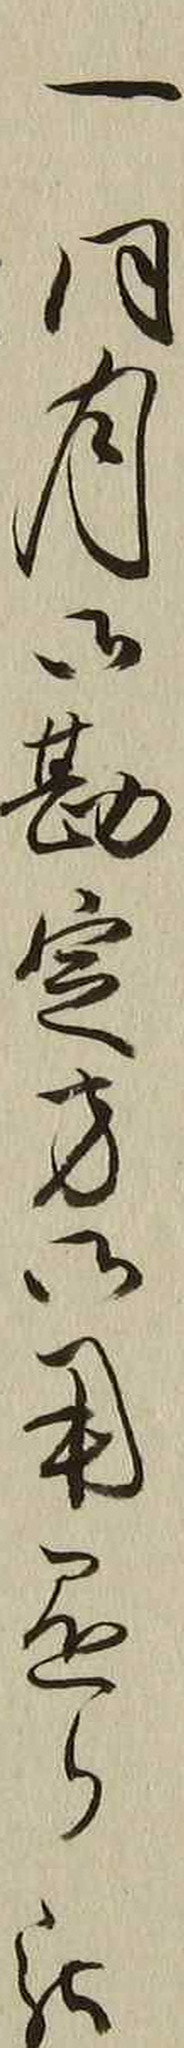一同月御勘定方御用懸り被
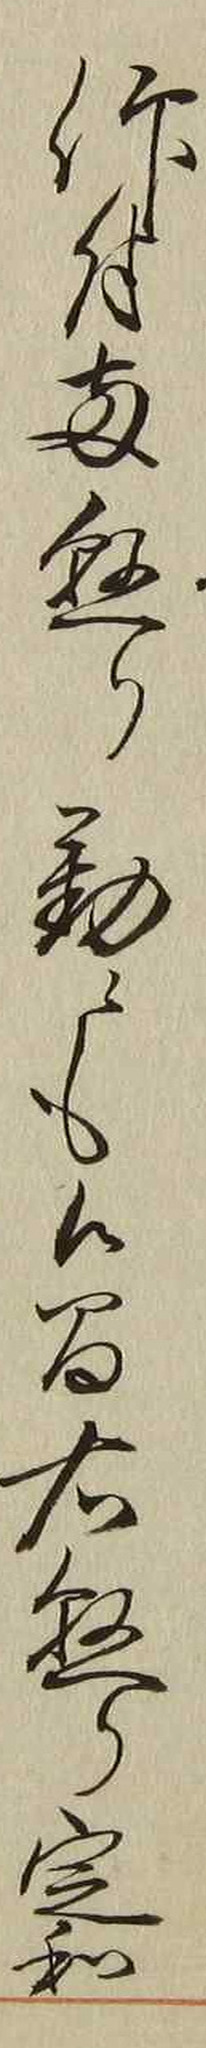仰付両懸り勤ニも候間右懸り定り
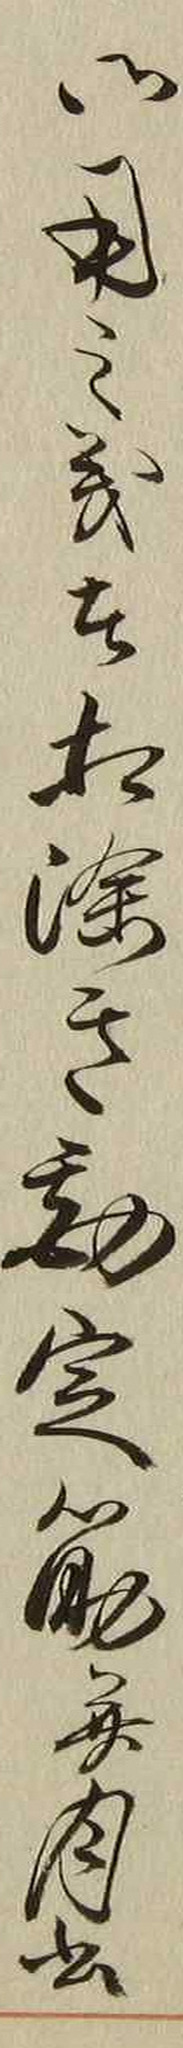御用之義は相除き勘定筋并月書
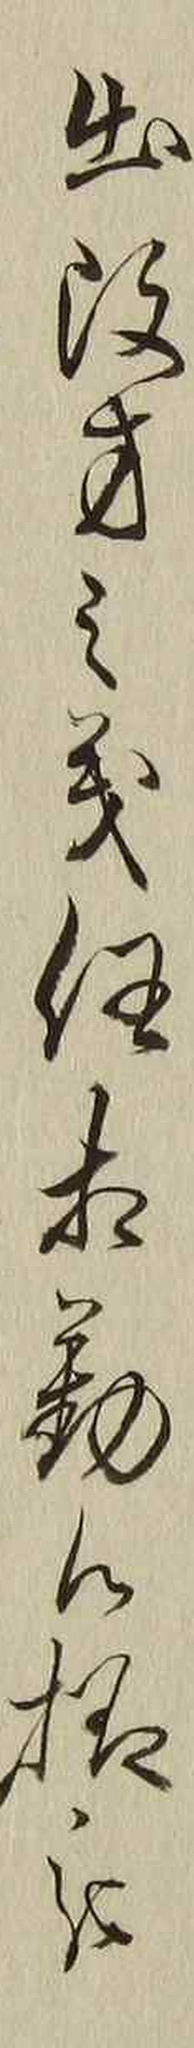出改方之義任相勤候様被
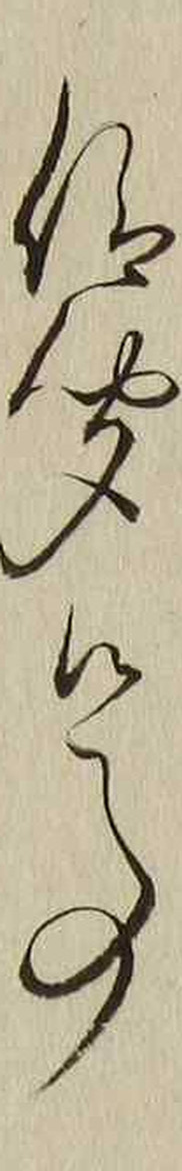仰聞候事
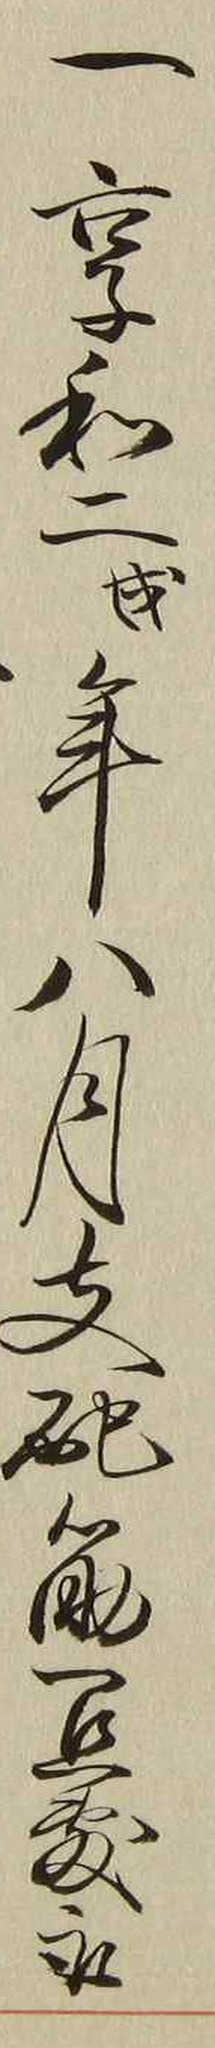一享和二戌年八月支配筋宜敷取
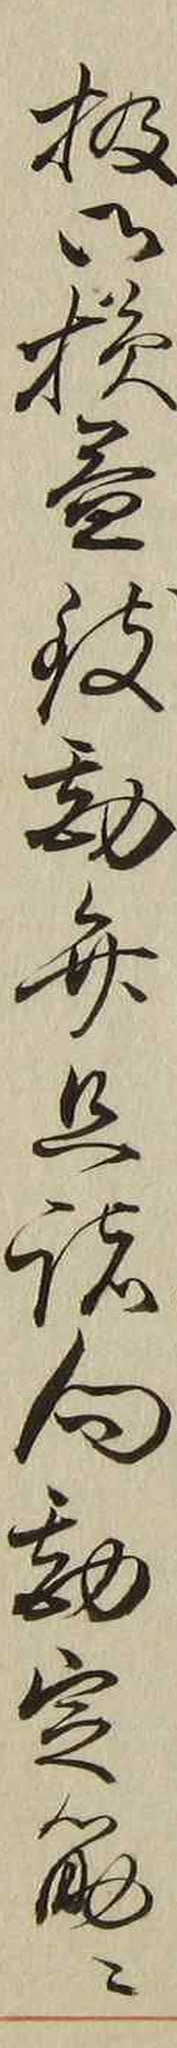扱御損益致勘弁且諸向勘定筋ニ
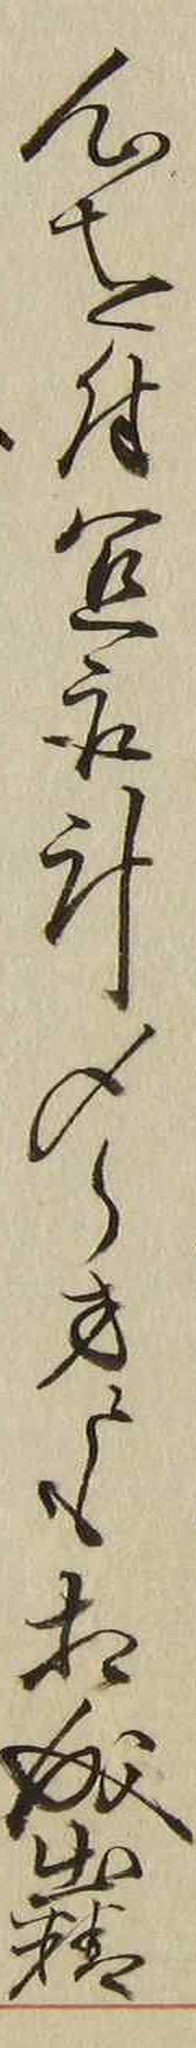心を付宜取計〆り方ニも相成出精
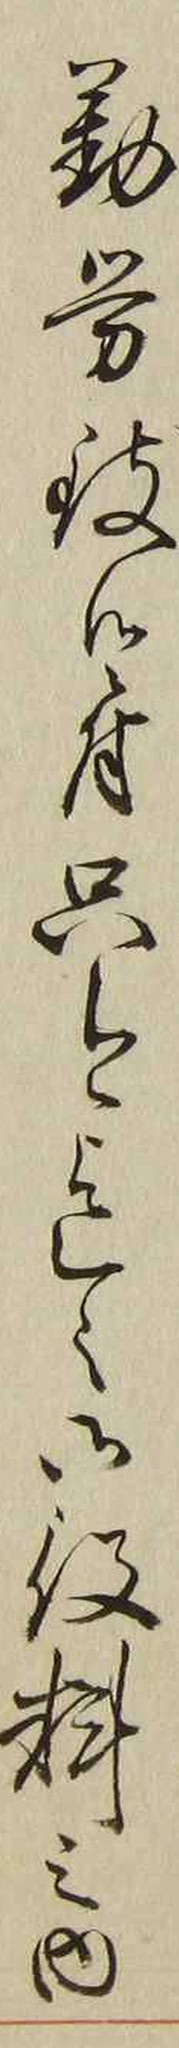勤労致候ニ付只今迄之御役料之内

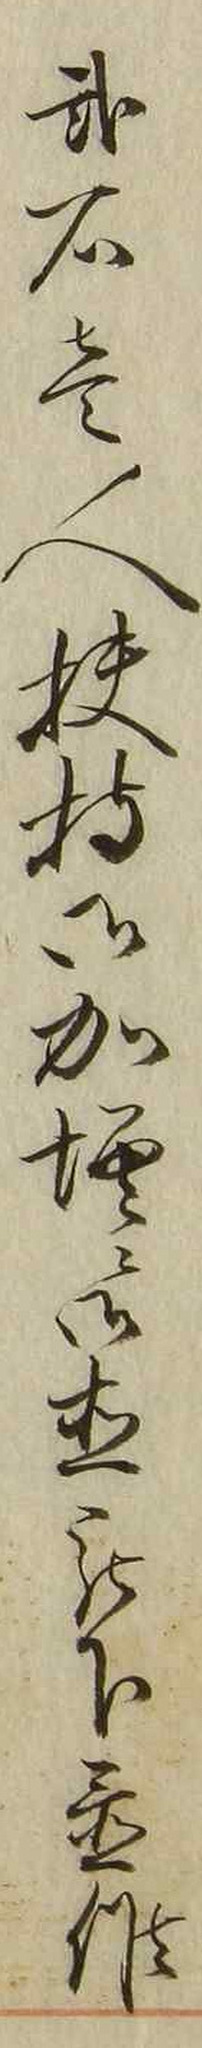弐石壱人扶持御加増ニ御直被下置候
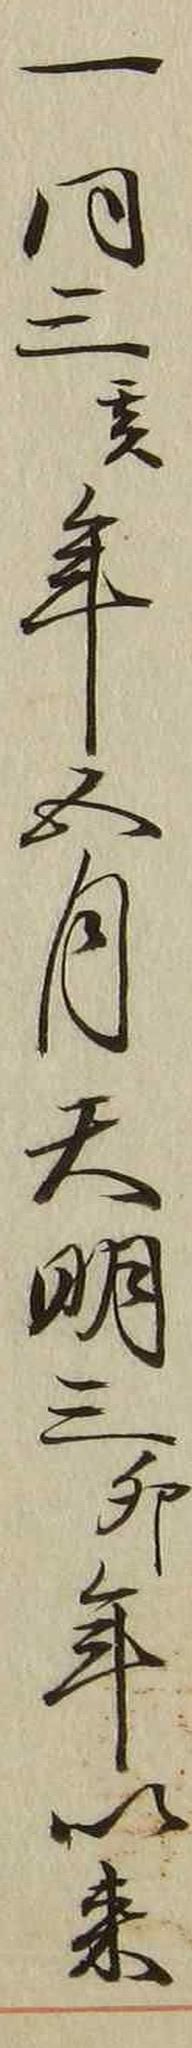一同三亥年五月天明三卯年以来
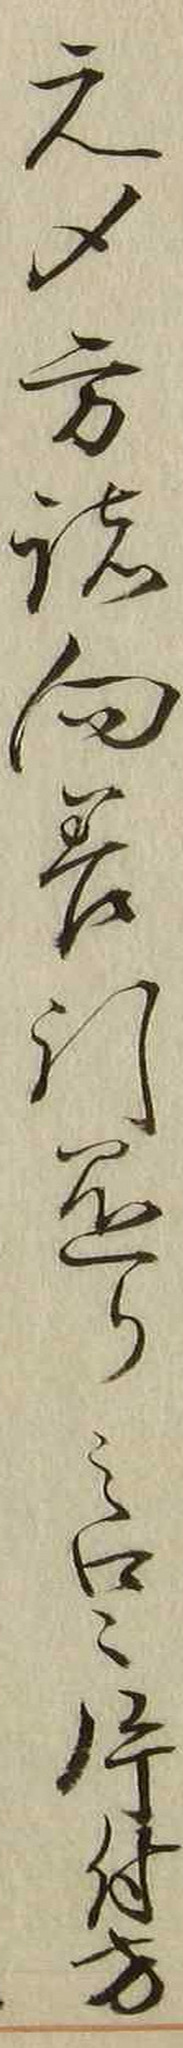元〆方諸向差引懸り之足片付方
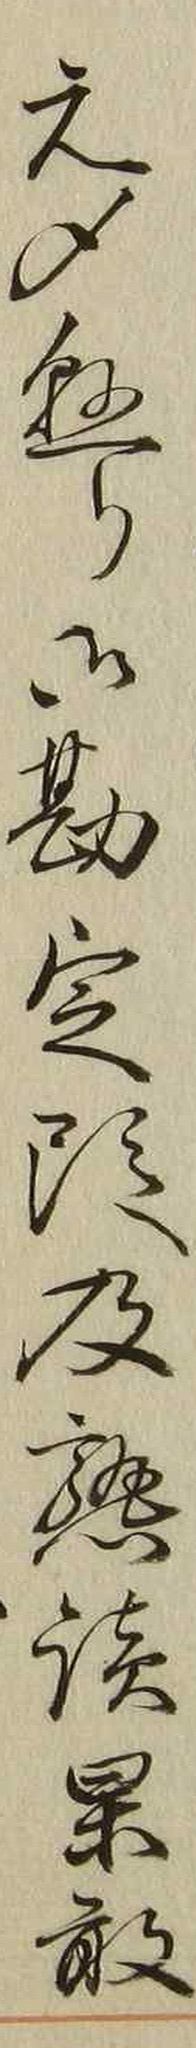元〆懸り御勘定頭及熟談果敢
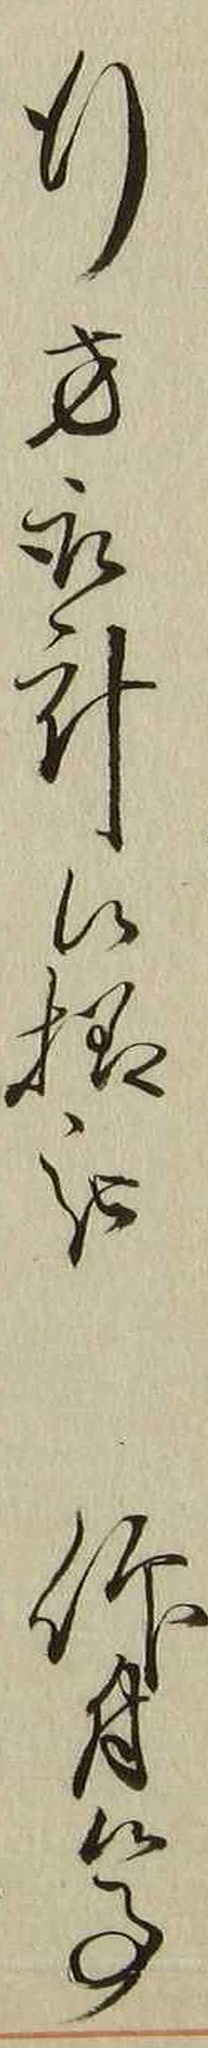行方取計候様被仰付候事
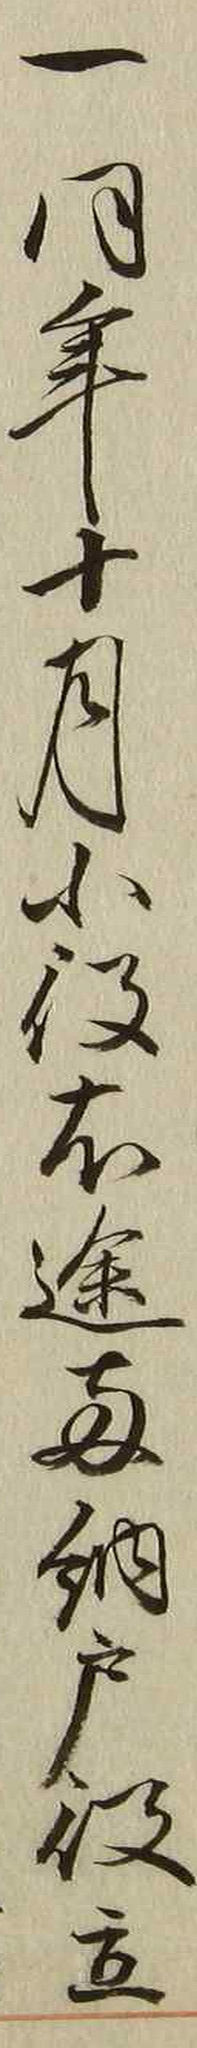一同年十月小役本途両納戸役立
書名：諸士系譜　巻之57　ほ之部4
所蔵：会津若松市立会津図書館
